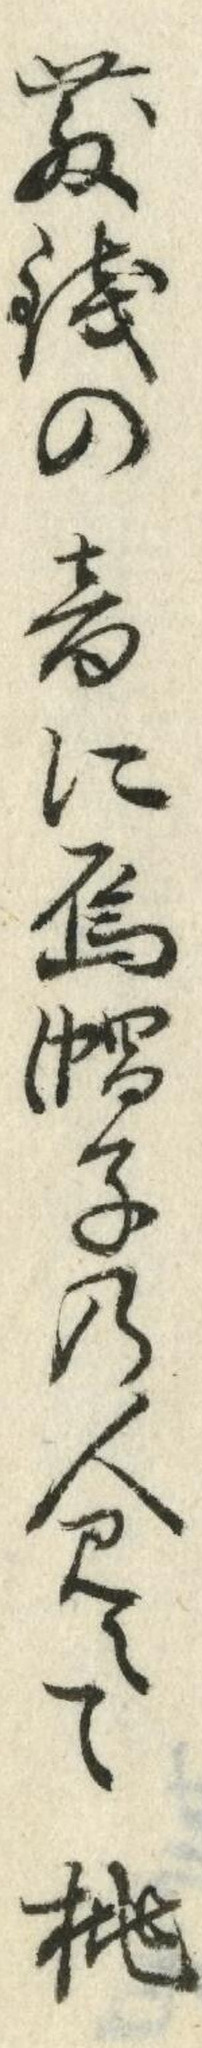撒銭の音に烏帽子の人見へて桃
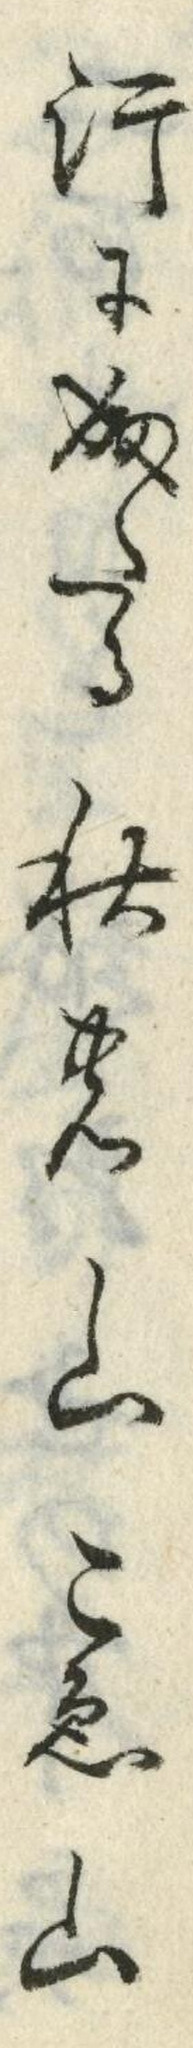行に成たる秋の山こゑ山
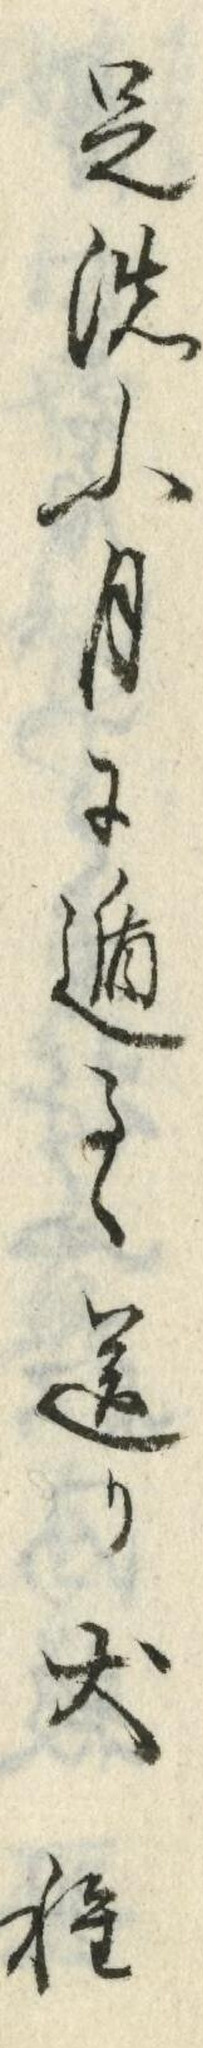足洗に月に遁るゝ送り犬種
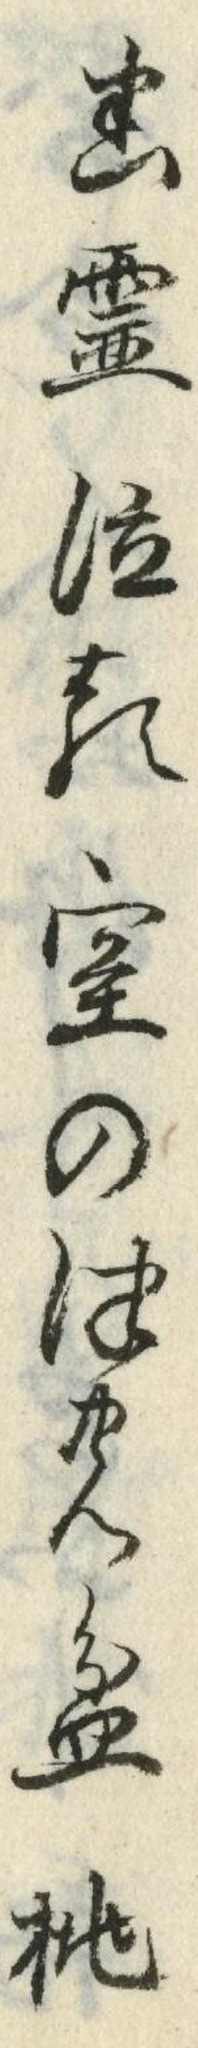幽霊泣る室のつの盆桃
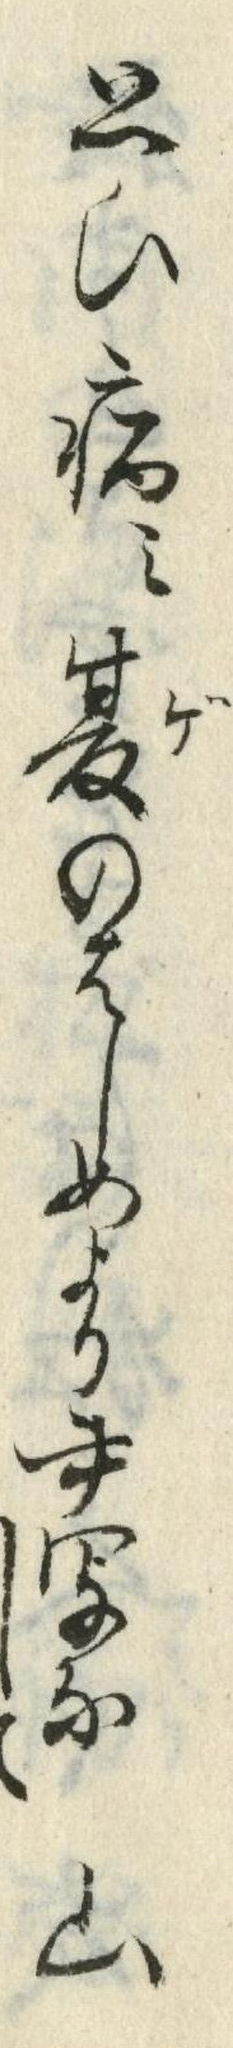思ひ病ミ夏のはしめより書写なして山
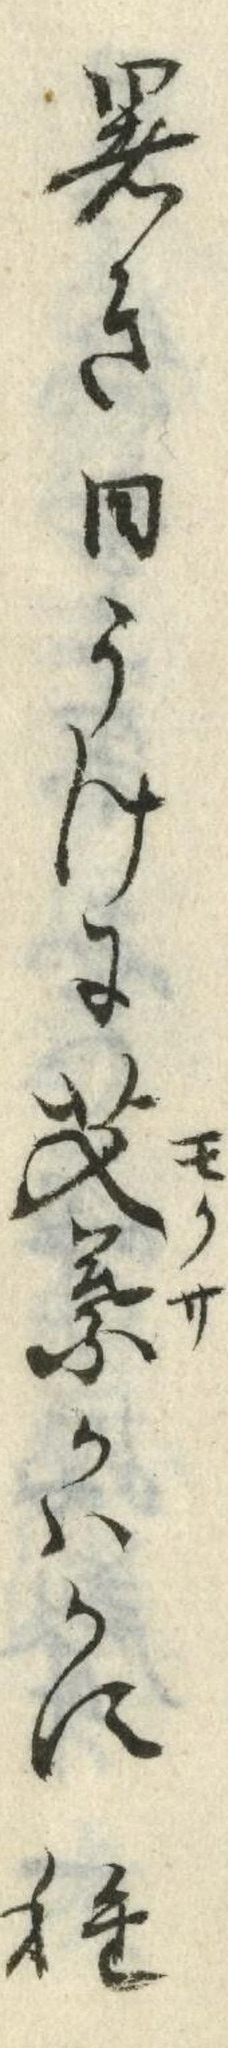暑き日かけに艾葉かはかす種

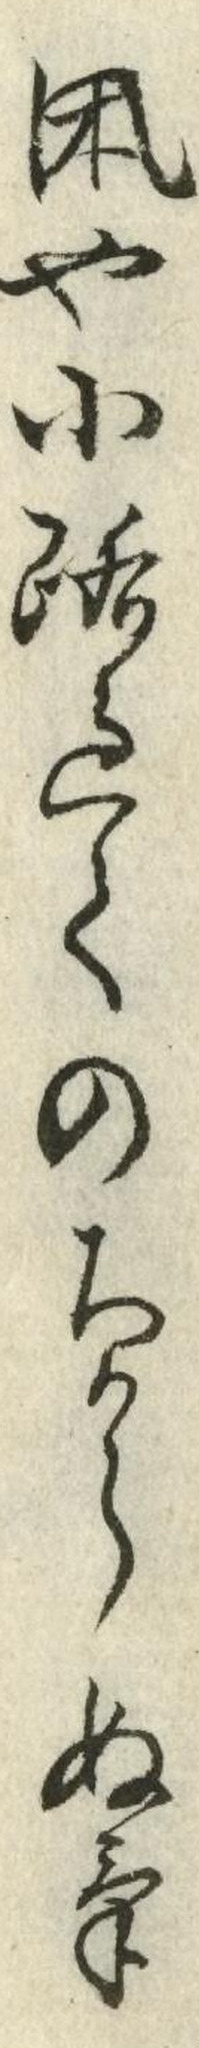凩や小路過てのちからぬけ筆貞
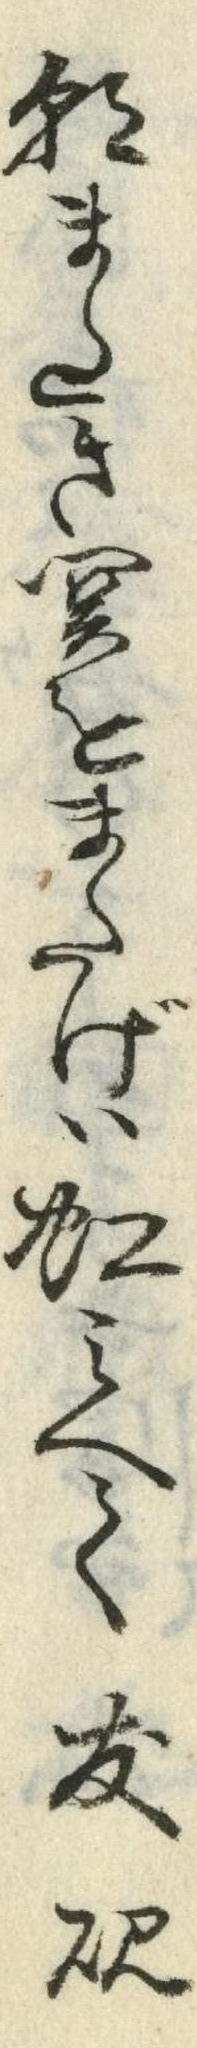朝またき関をまたげは虹みへて友硯
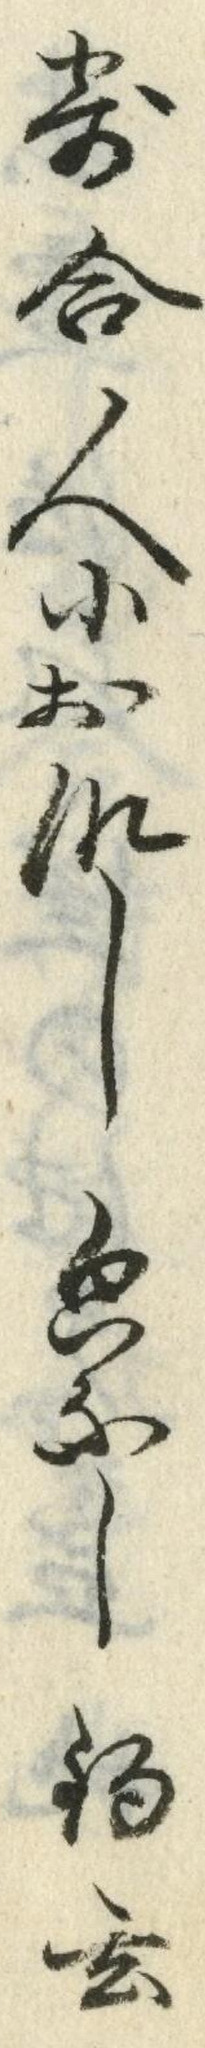寄合人におなし㒵なし釣玄
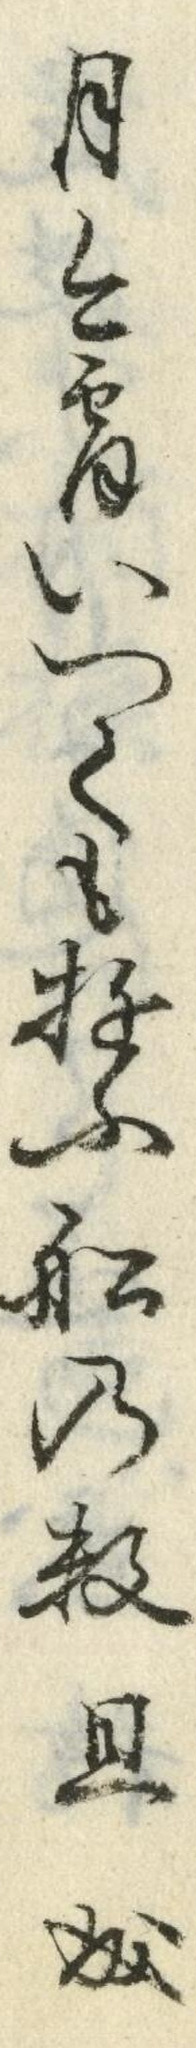月今宵いつくも遊ふ船の数旦成
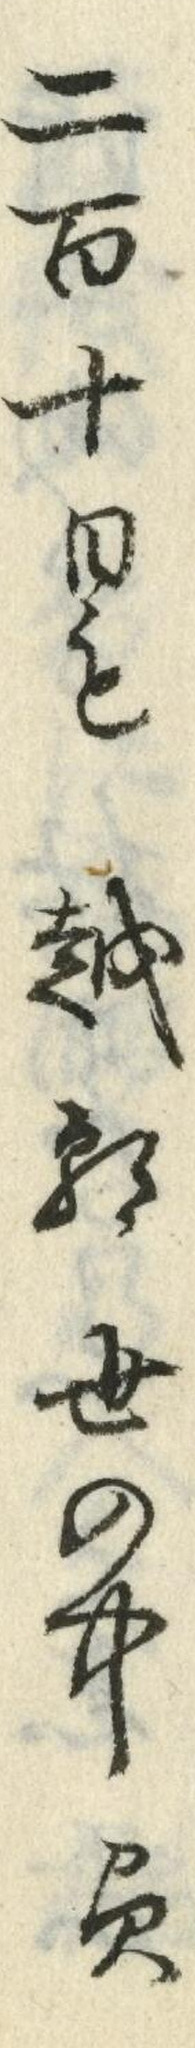二百十日も越る世の中員
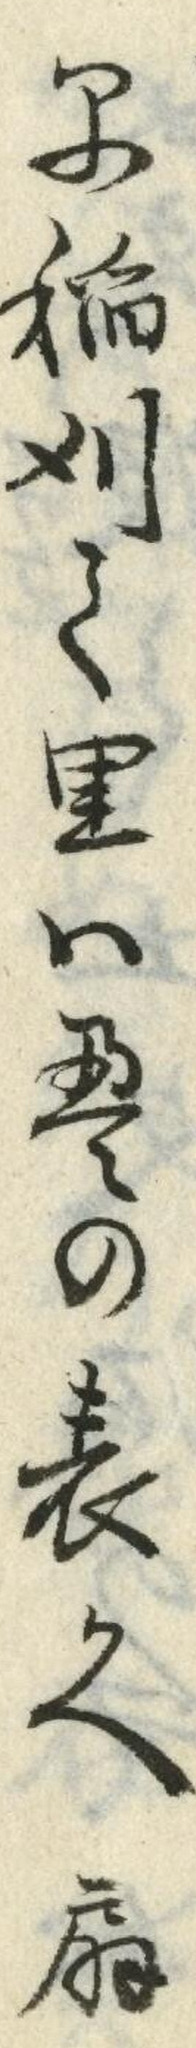早稲刈て里は畳の表かへ扇
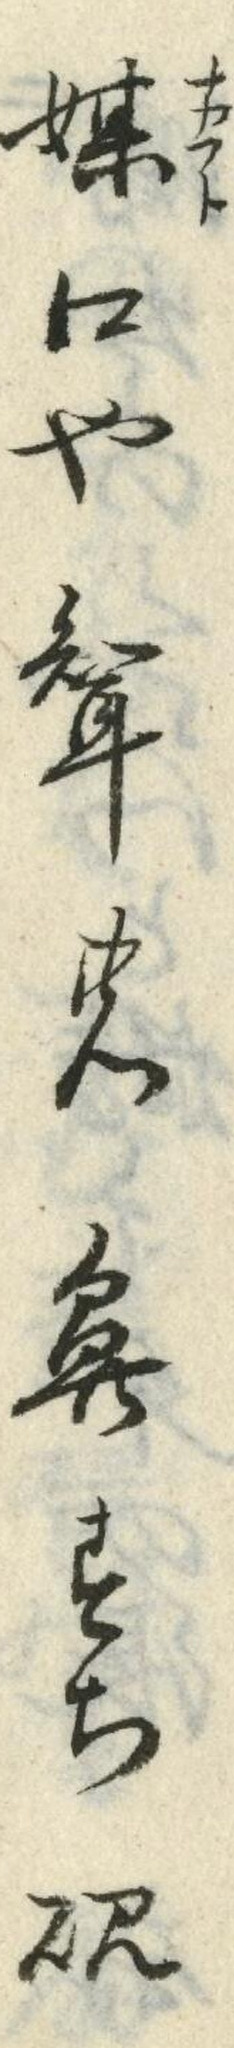媒口や聟の鼻すち硯
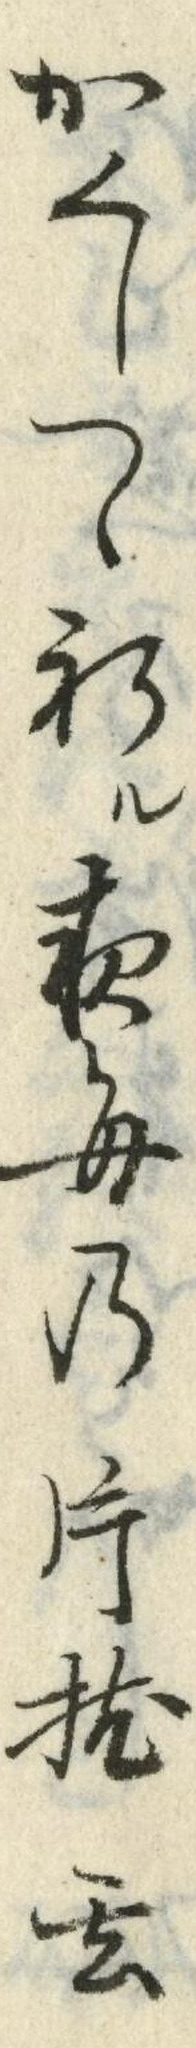かくしつゝ折る夜毎の片枕玄
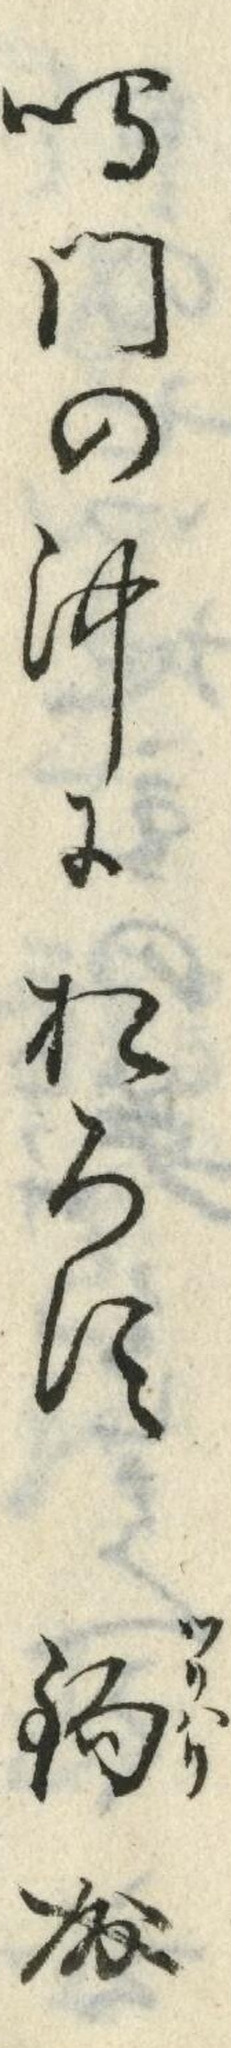鳴門の沖におろす鉤成
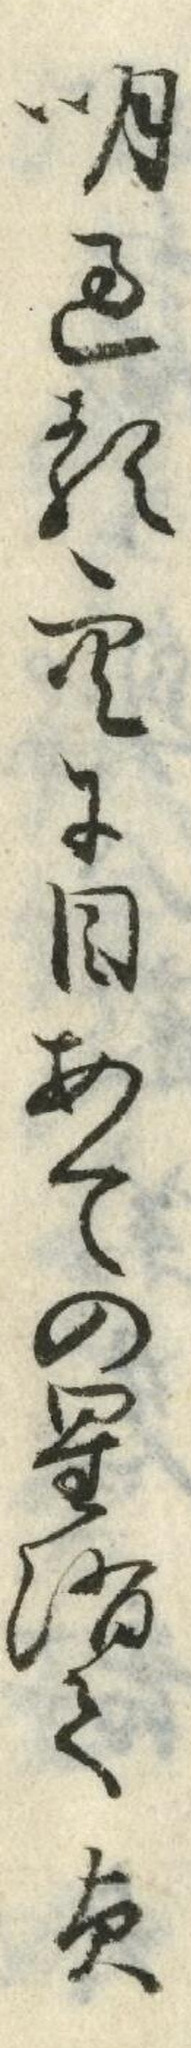明過る空に目あての星消て貞
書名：誹諧　能登釜
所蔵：Ishikawa Prefectural Library
